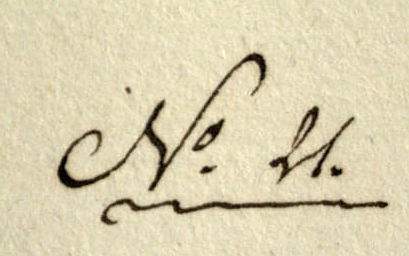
No 21.
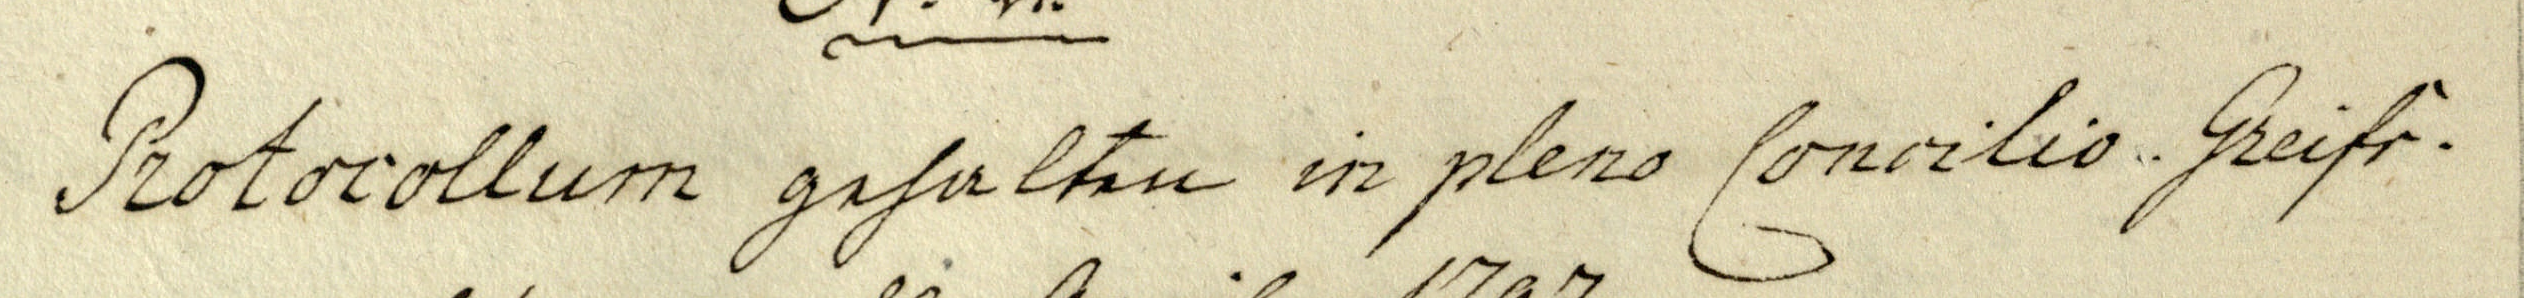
Protocollum gehalten in pleno Concilio Geifs¬
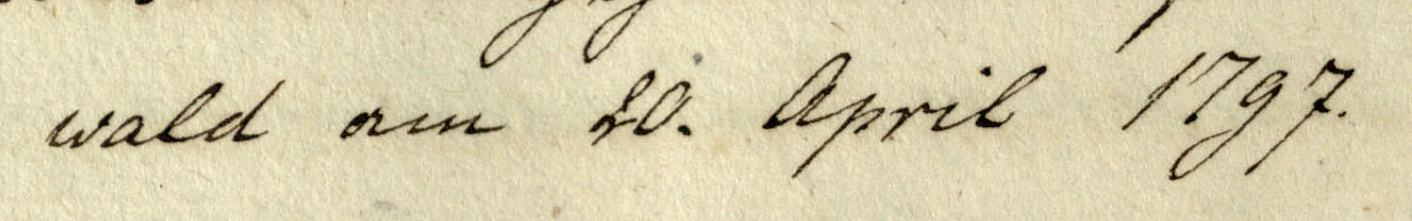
wald am 20. April 1797.
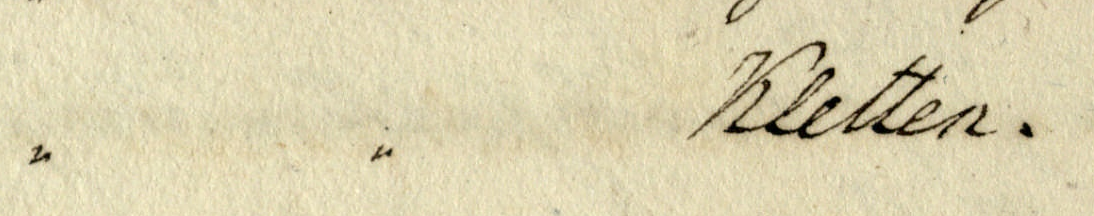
Kletten.
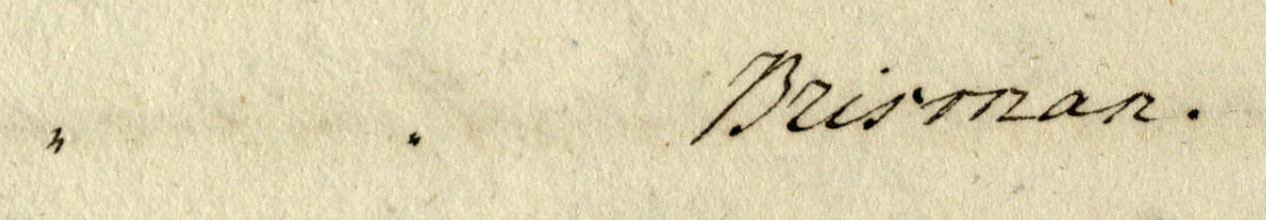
Brisman.
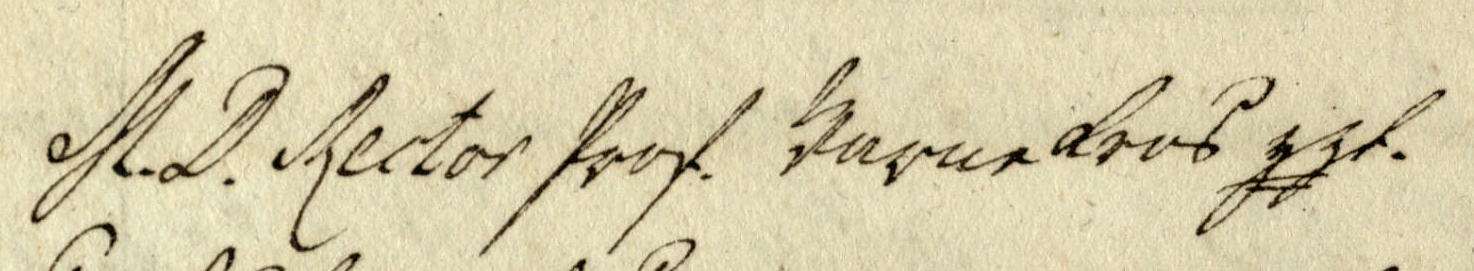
M. D. Rector Prof. Warnekros ppt
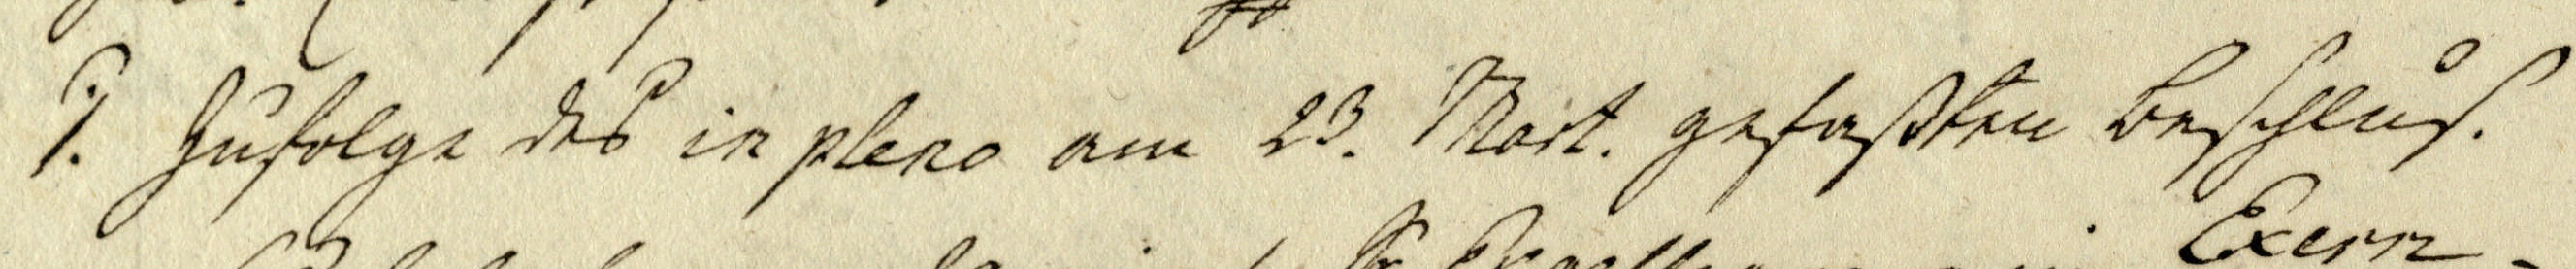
1. Zufolge des in pleno am 23. Mart., gefaßten Beschlus¬
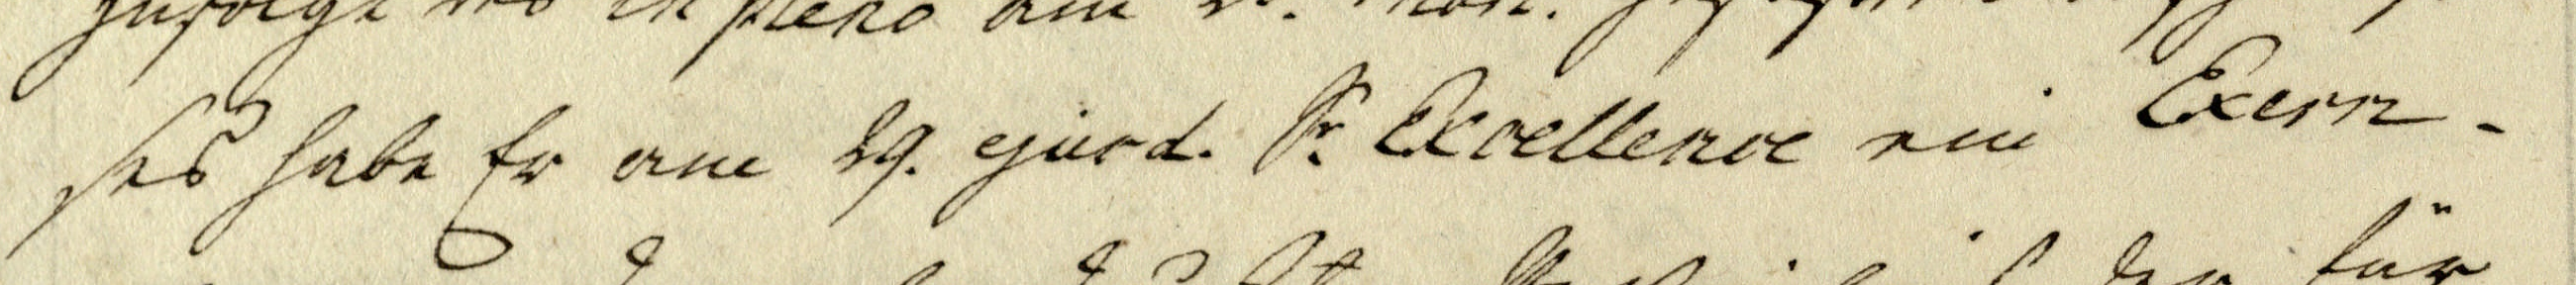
ses habe Er am 29. ejusd. Sr. Excellence ein Exem¬
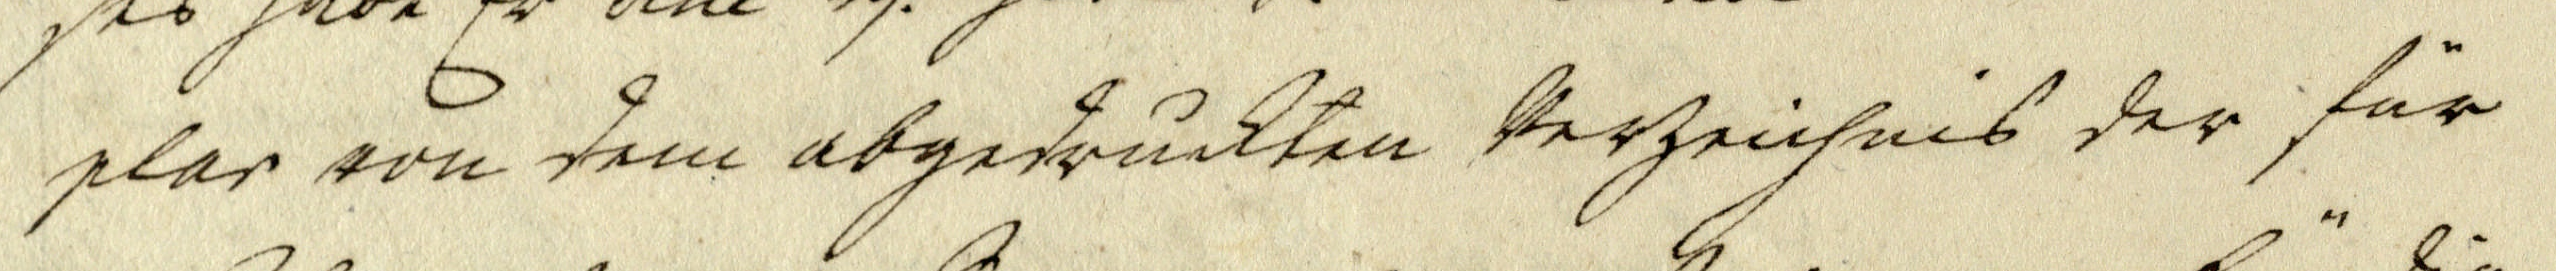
plar von dem abgedruckten Verzeichnis der für
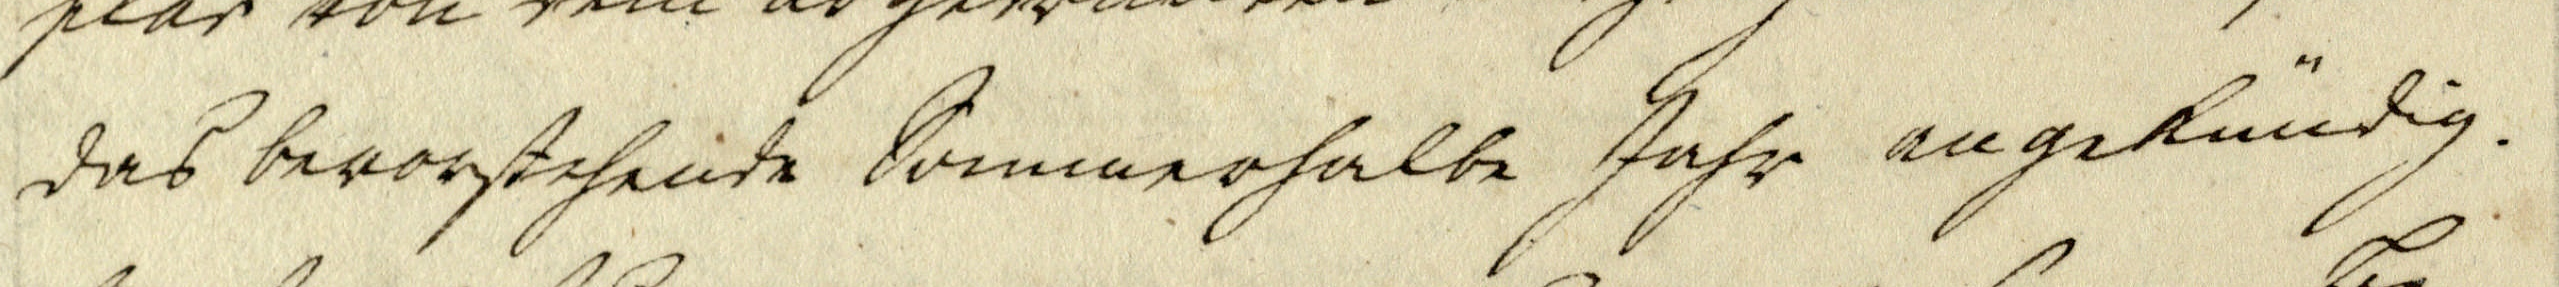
das bevorstehende Sommerhalbe Jahr angekündig¬
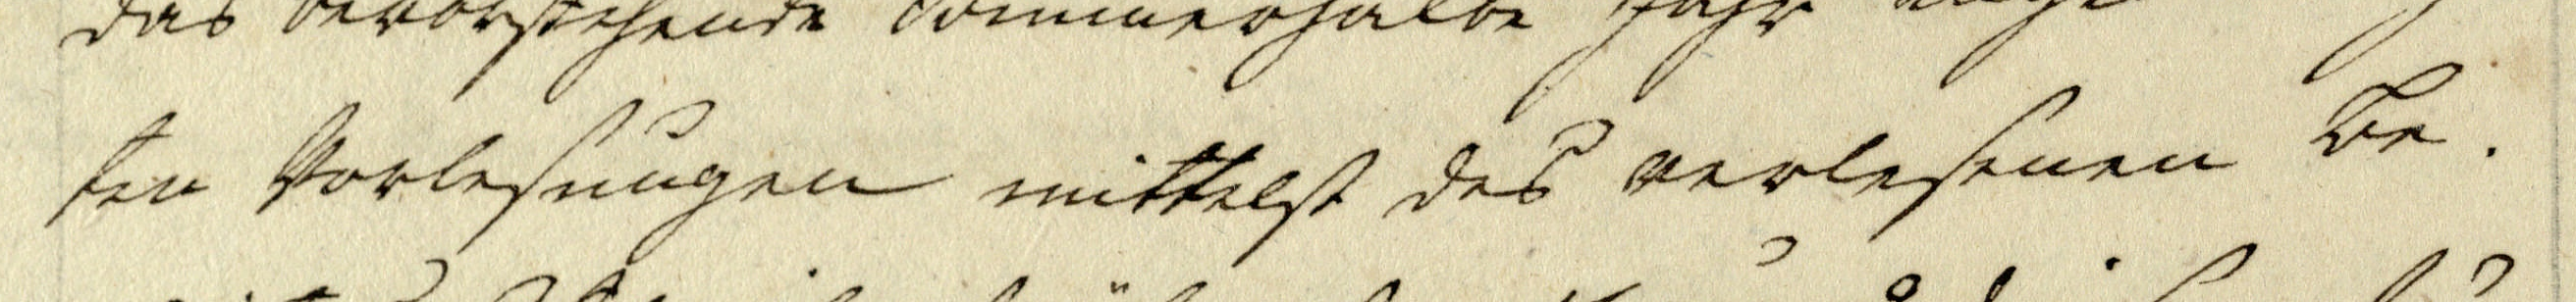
ten Vorlesungen mittelst des verlesenen Be¬
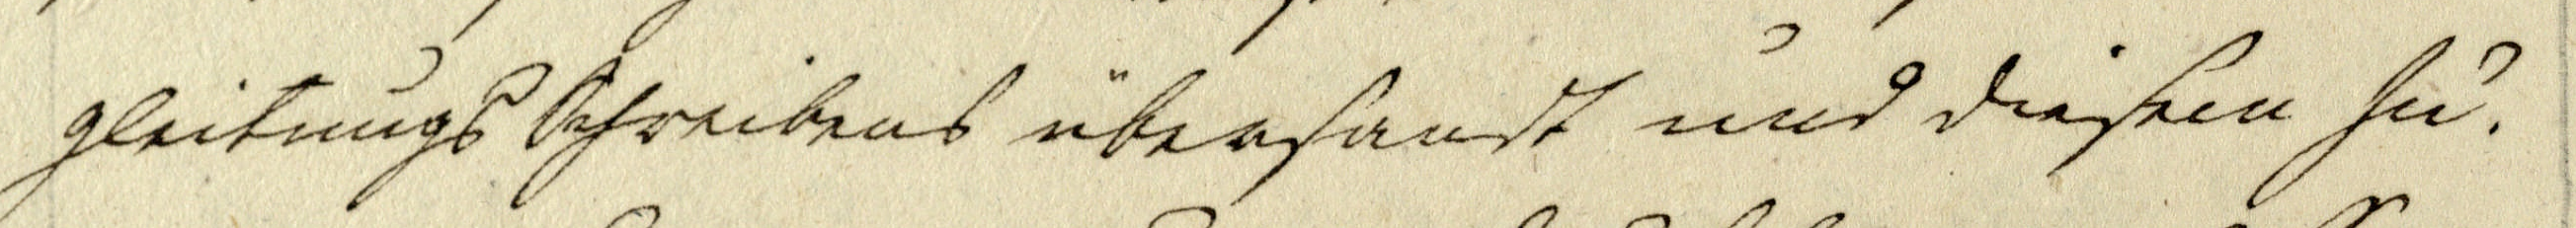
gleitungs Schreibens übersandt und diesem zu¬
